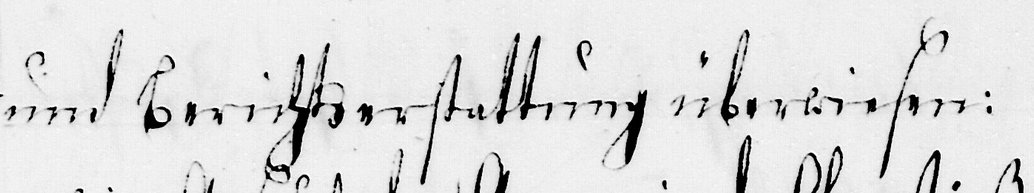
und Berichtserstattung überwiesen:
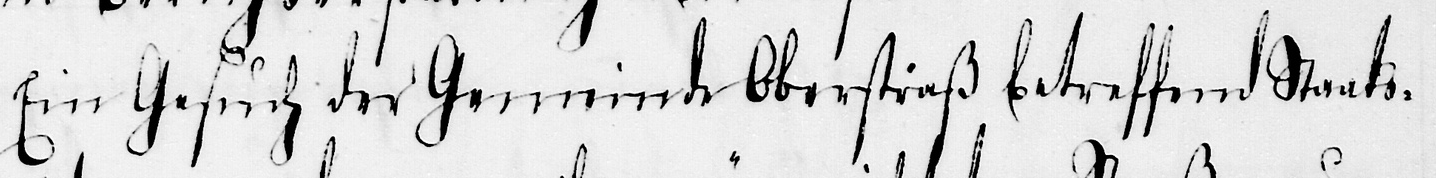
Ein Gesuch der Gemeinde Oberstraß betreffend Staats¬
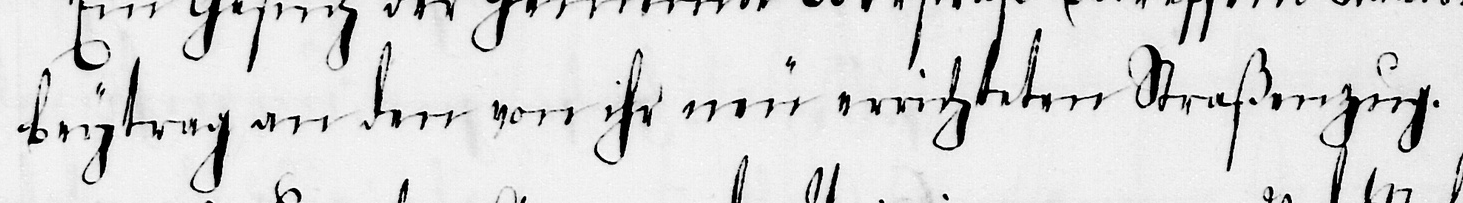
beytrag an den von ihr neu errichteten Straßenzug.
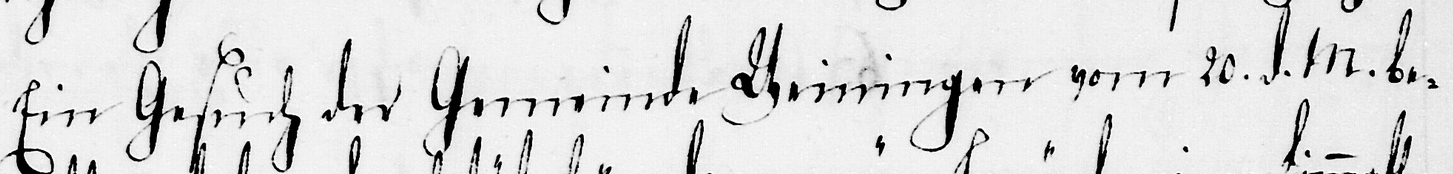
Ein Gesuch der Gemeinde Weiningen vom 20. d. M. be¬
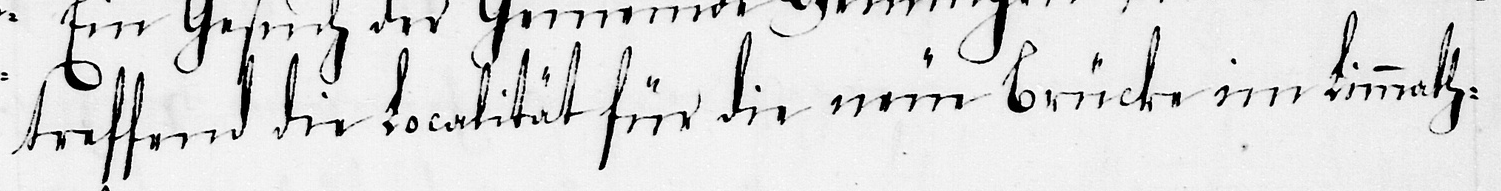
treffend die Localität für die neue Brücke im Limmath¬
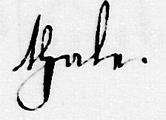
thale.
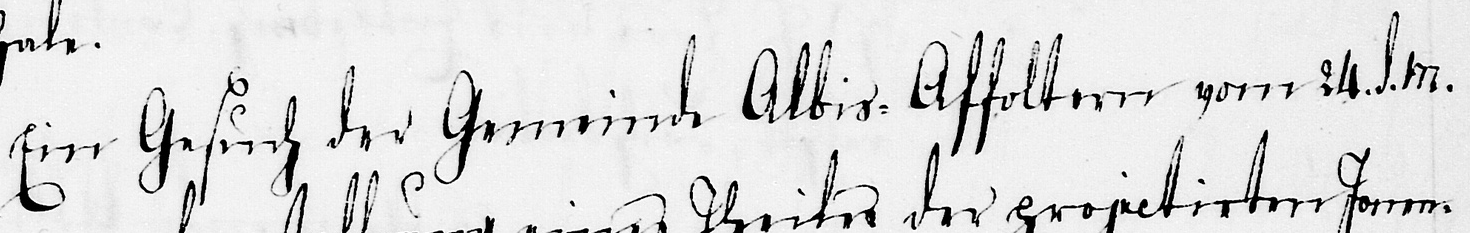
Ein Gesuch der Gemeinde Albis-Affoltern vom 24. d. M.
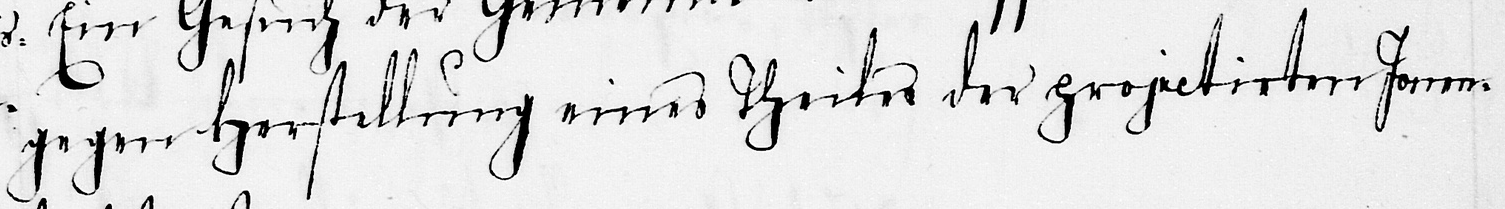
gegen Herstellung eines Theiles der projectirten Jonen¬
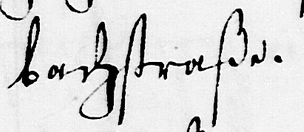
bachstraße.
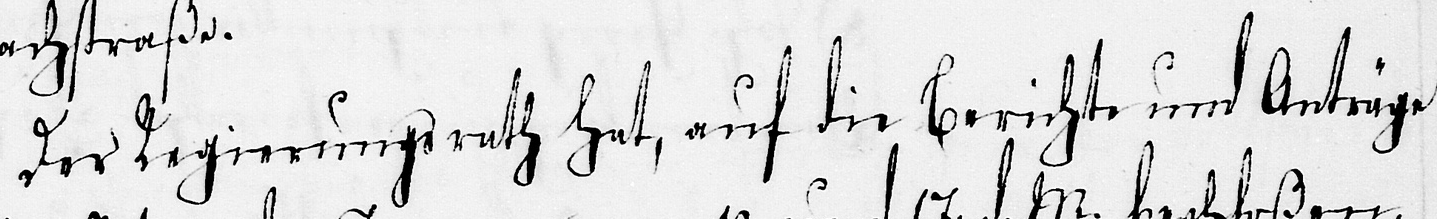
Der Regierungsrath hat, auf die Berichte und Anträge
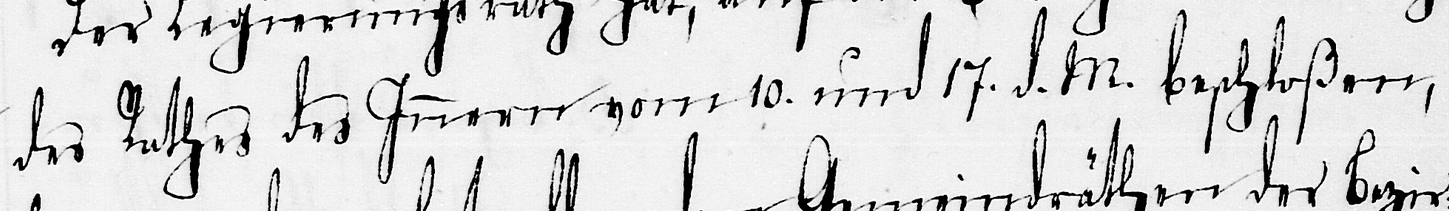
des Rathes des Innern vom 10. und 17. d. M. beschloßen,
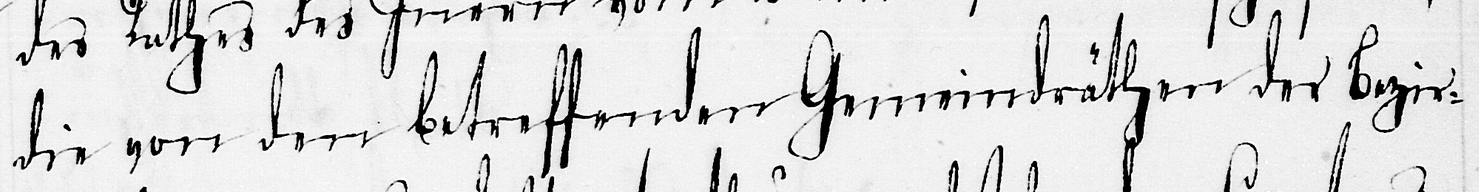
die von den betreffenden Gemeindräthen der Bezir¬
